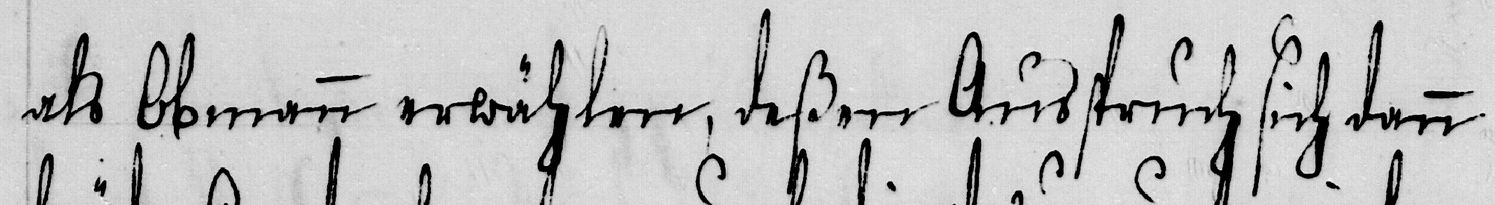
als Obmann erwählen, deßen Ausspruch sich dann
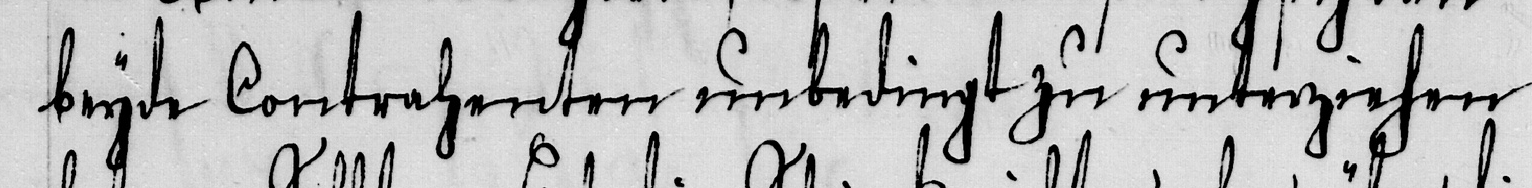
beyde Contrahenten unbedingt zu unterziehen
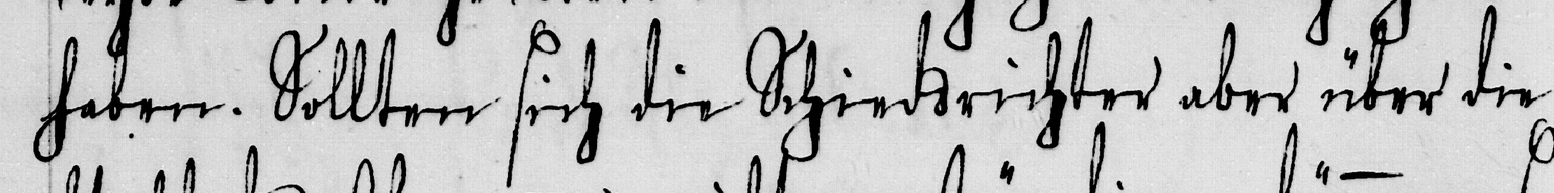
haben. Sollten sich die Schiedsrichter aber über die
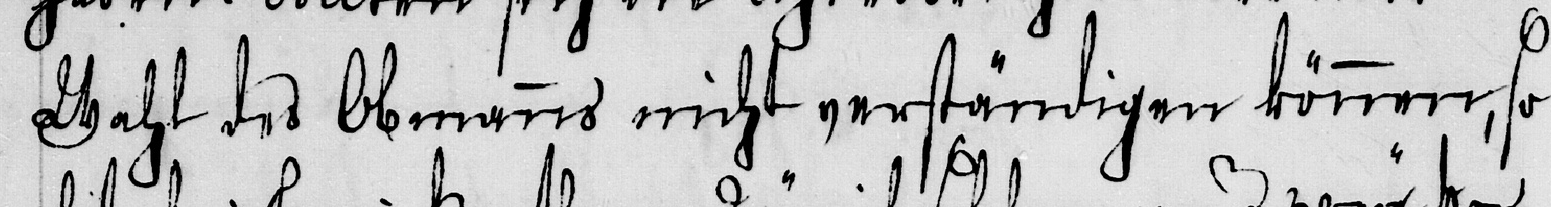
Wahl des Obmanns nicht verständigen können, so
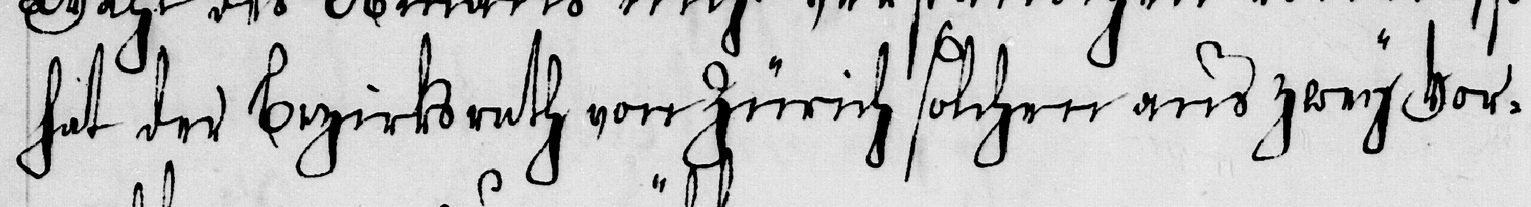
hat der Bezirksrath von Zürich solchen aus zwey Vor¬
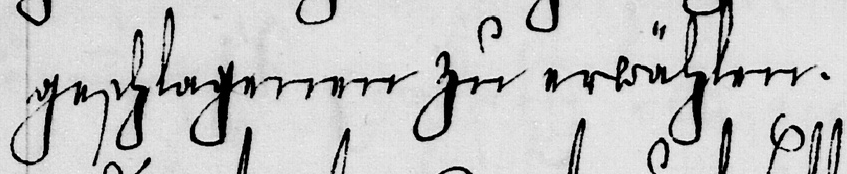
geschlagenen zu erwählen.
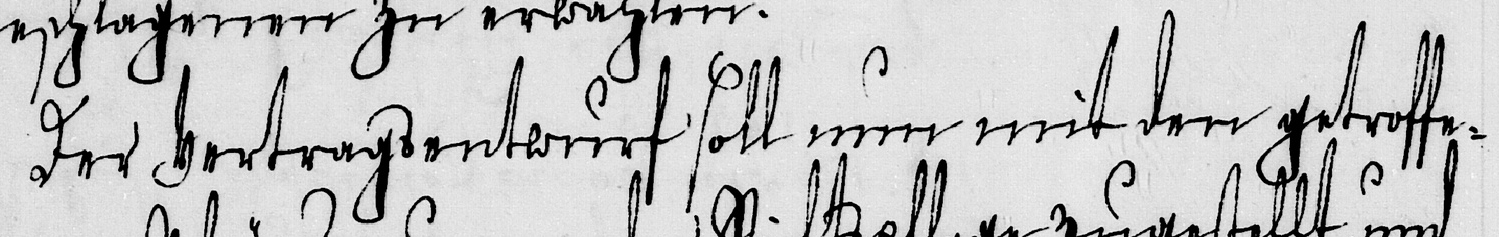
Der Vertragsentwurf soll nun mit den getroff¬
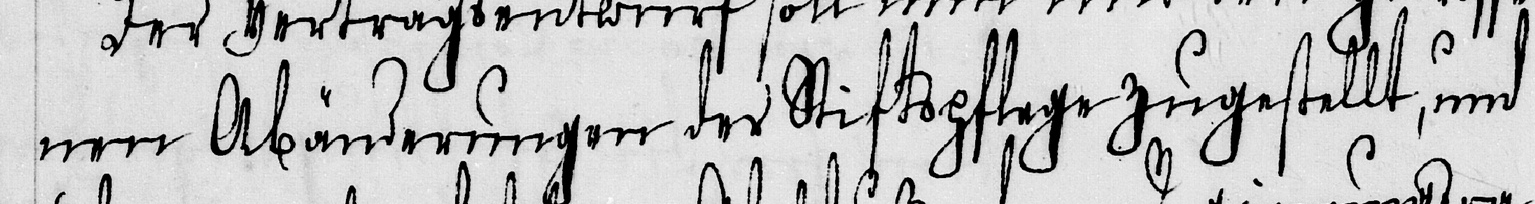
enen Abänderungen der Stiftspflege zugestellt, und
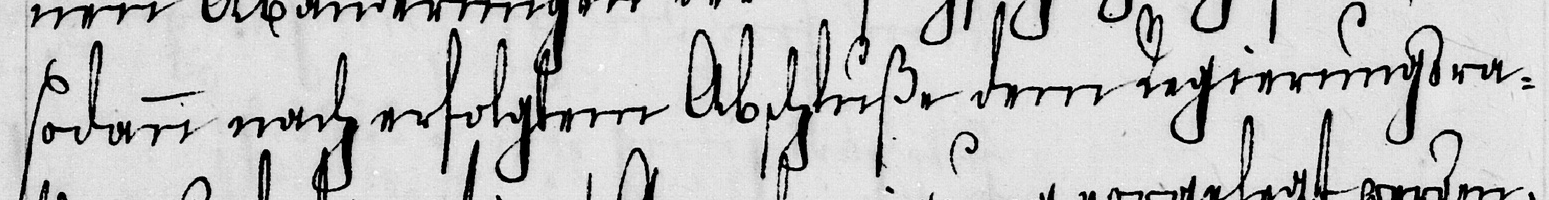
sodann nach erfolgtem Abschluße dem Regeirungsra¬
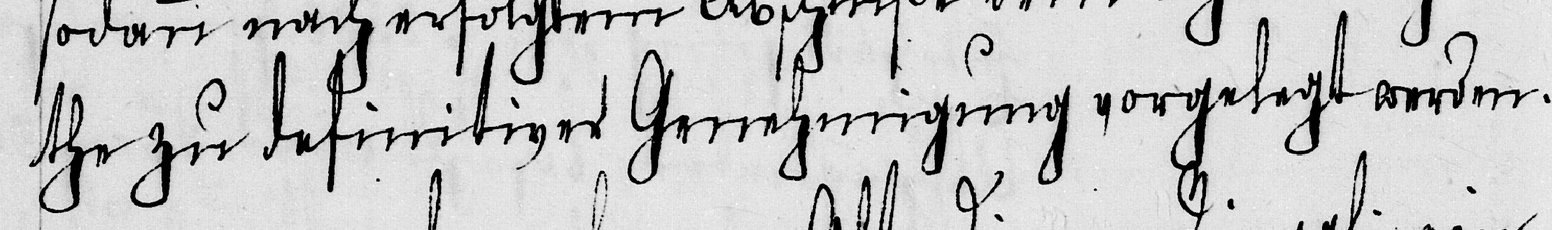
the zu definitiver Genehmigung vorgelegt werden.
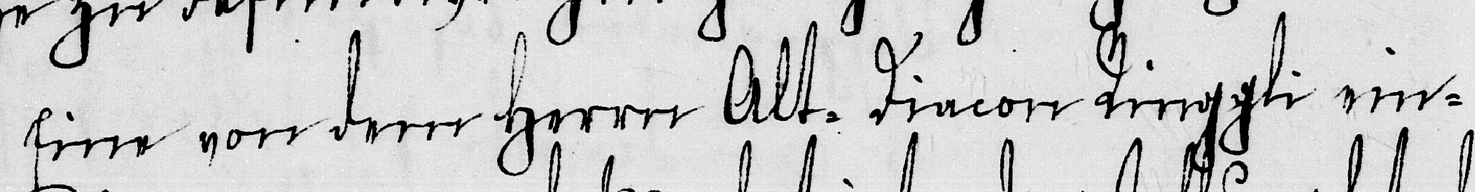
Eine von dem Herrn Alt-Diacon Ringgli ein¬
